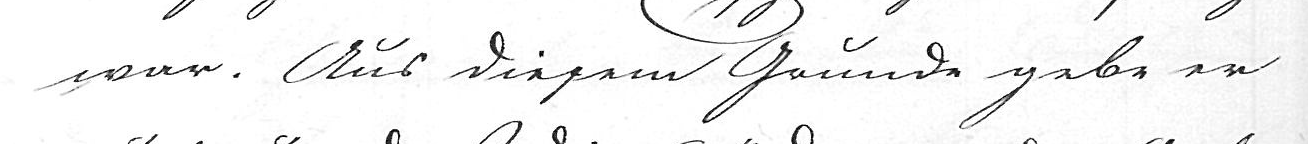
war. Aus diesem Grunde gebe er
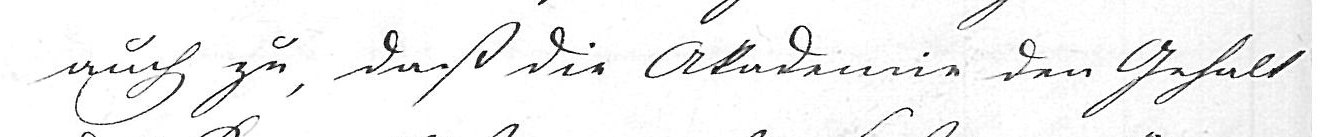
auch zu, daß die Akademie den Gehalt
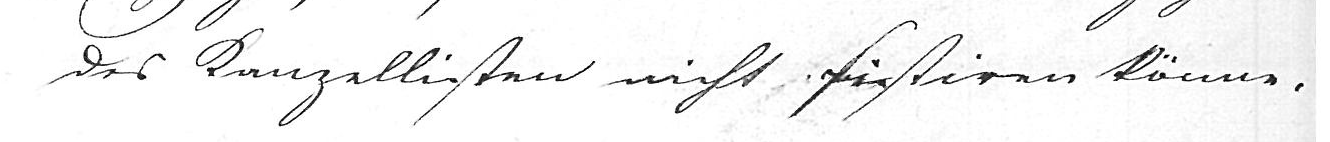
des Kanzellisten nicht sistiren könne.
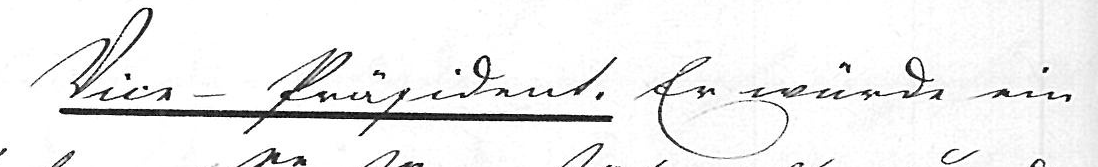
Vice-Präsident. Er würde ein
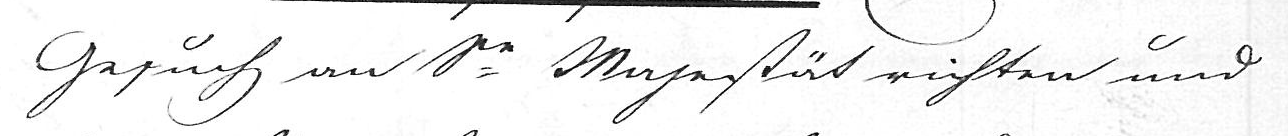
Gesuch an Sr Majestät richten und
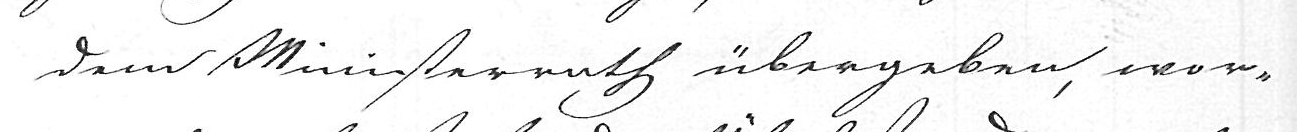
dem Ministerrath übergeben, wor-
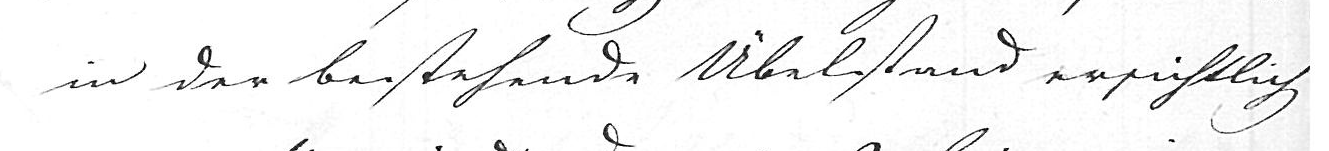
in der bestehenden Übelstand ersichtlich
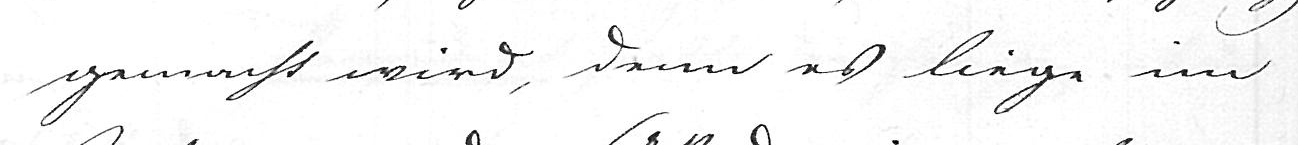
gemacht wird, denn es liege im
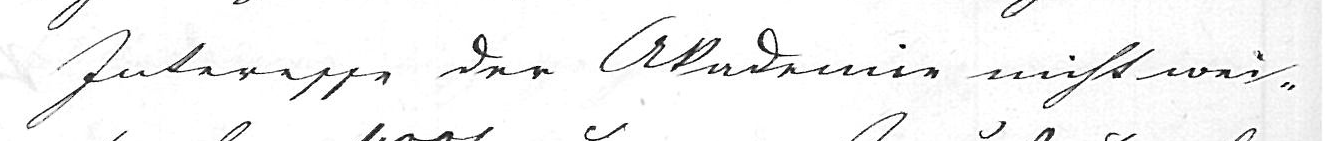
Interesse der Akademie nicht wei-
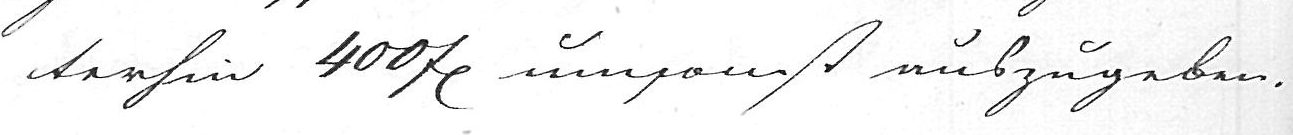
terhin 400 fl umsonst aufzugeben.
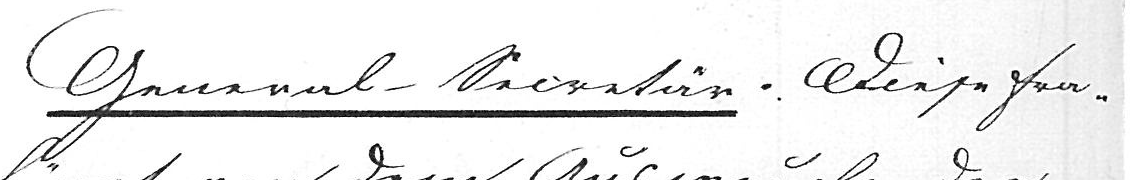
General- Secretär. Diese Fra-
